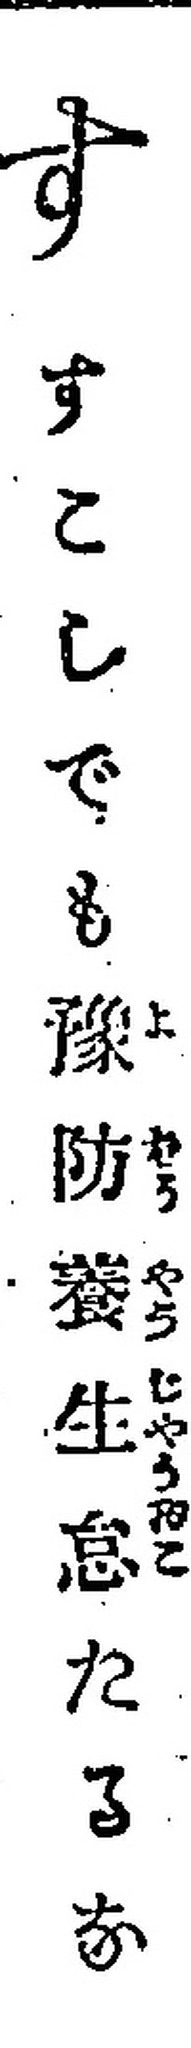すすこしでも豫防養生怠なるな
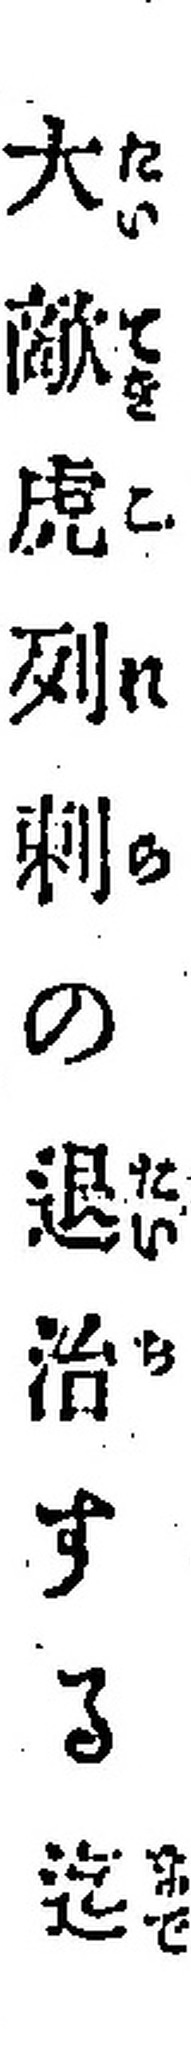大敵虎列刺の退治する迄
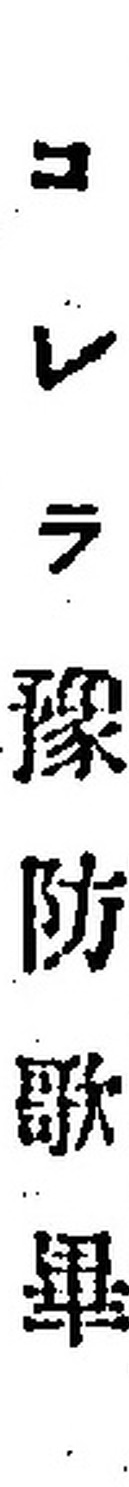コレラ豫防歌畢
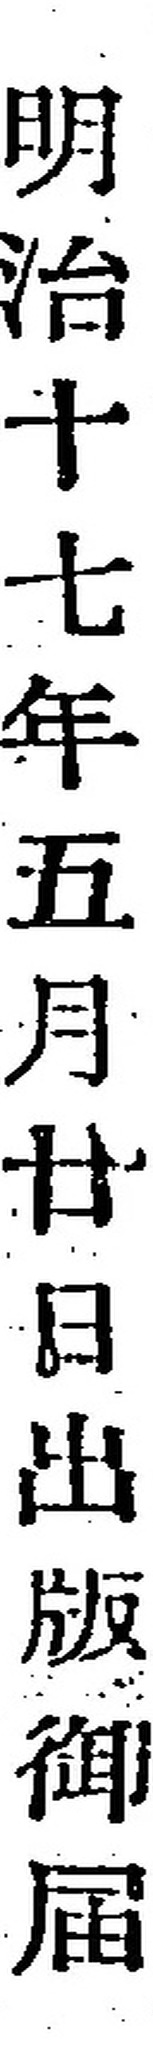明治十七年五月廿日出版御届
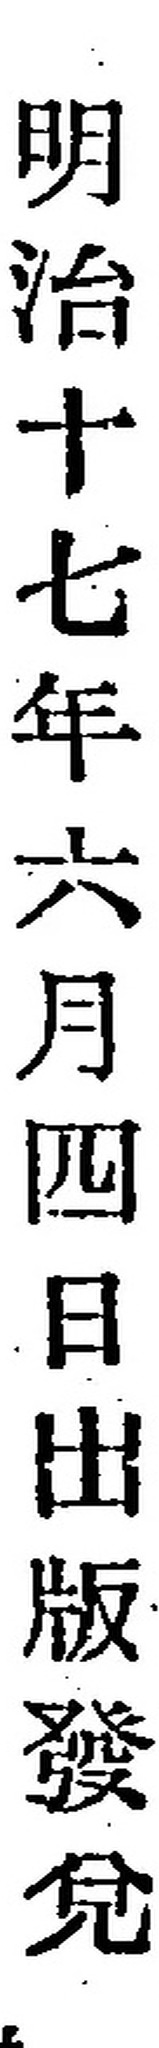明治十七年五月廿日出版御届
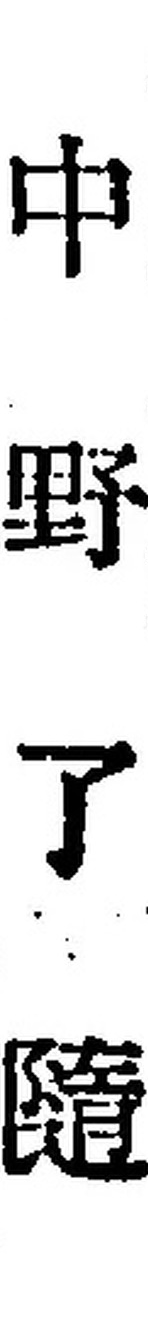中野了随
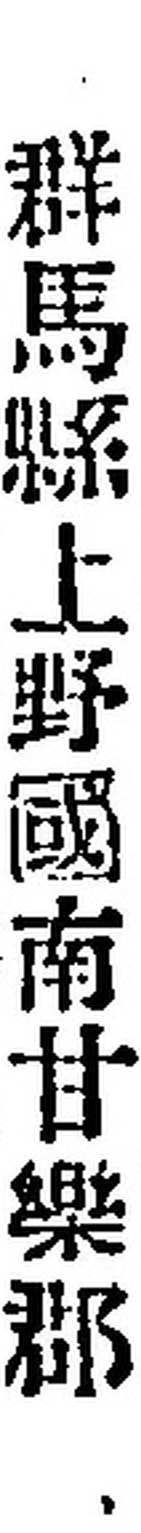群馬縣上野國南甘樂郡
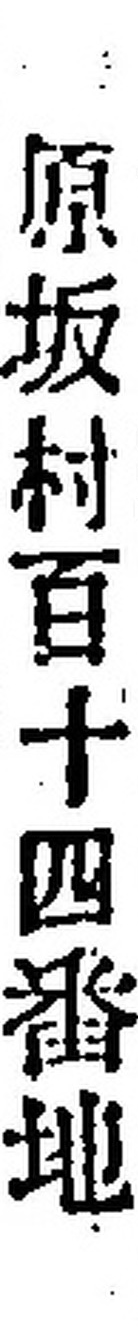原坂村百十四番地
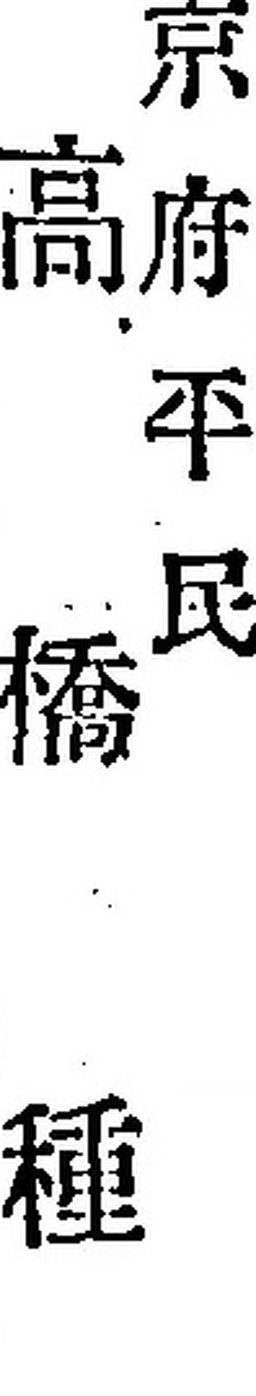高橋種
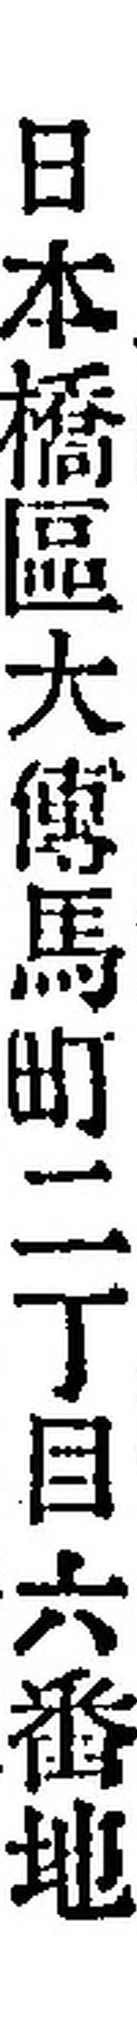日本橋區大傅馬町二丁目六番地
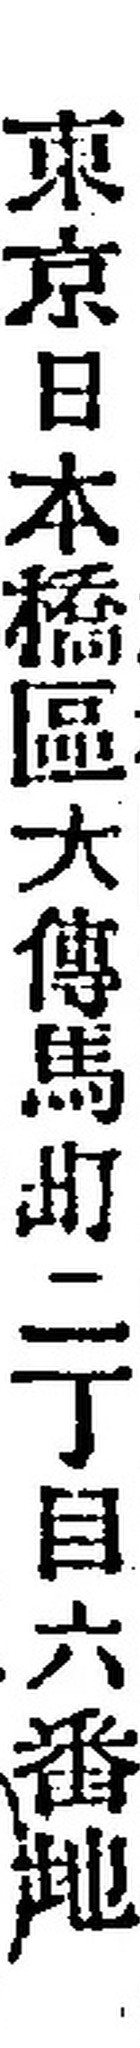日本橋區大傅馬町二丁目六番地
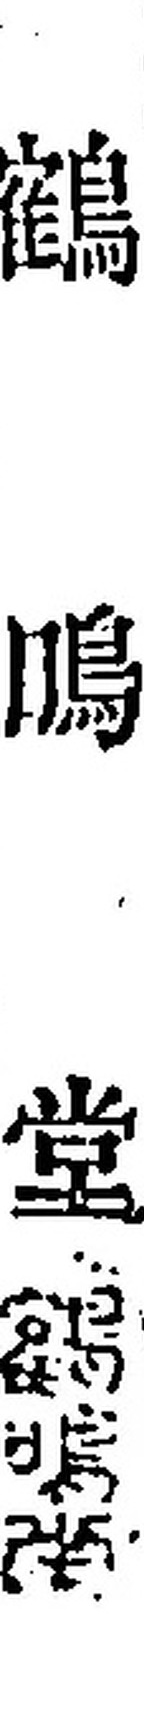鶴鳴堂鶴鳴堂
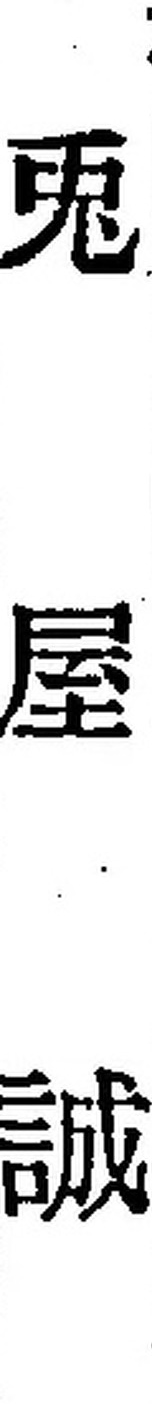兎屋誠
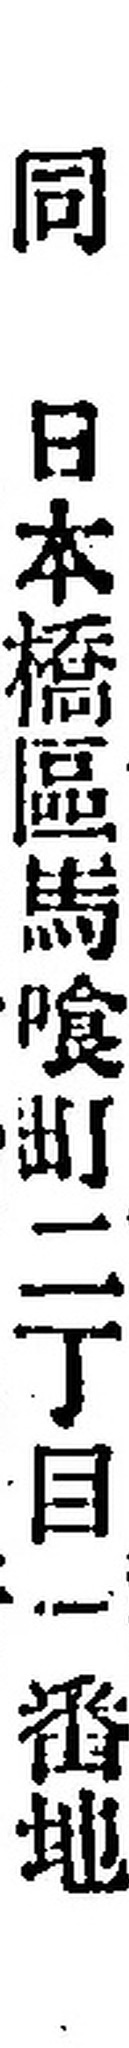同同日本橋區馬喰町二丁目一番地
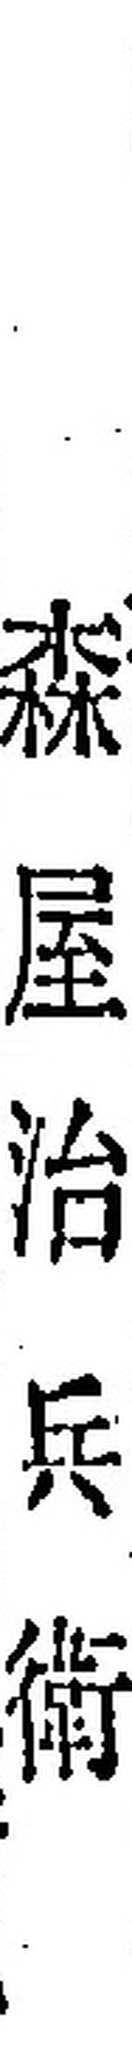森屋治兵衛
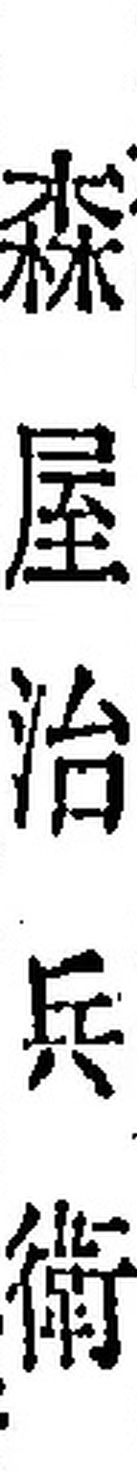森屋治兵衛
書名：新撰暑中養生法 : 附・コレラ予防歌
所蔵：国立国会図書館 National Diet Library, JAPAN
